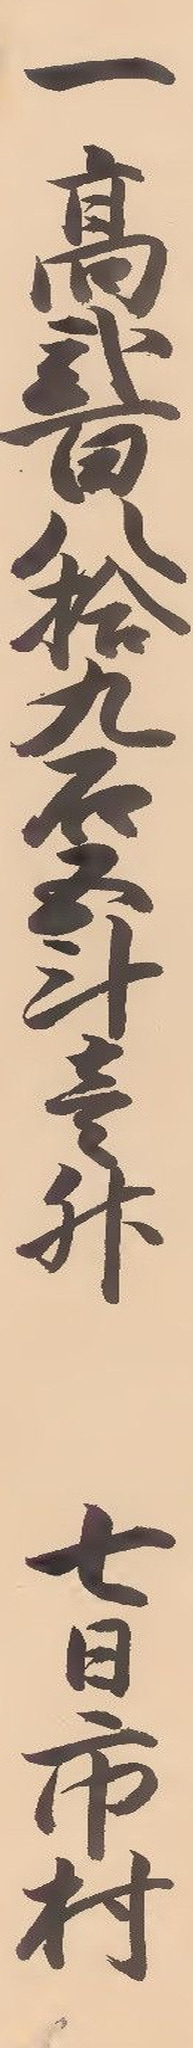一髙弐百八拾九石五斗壱升七日市村
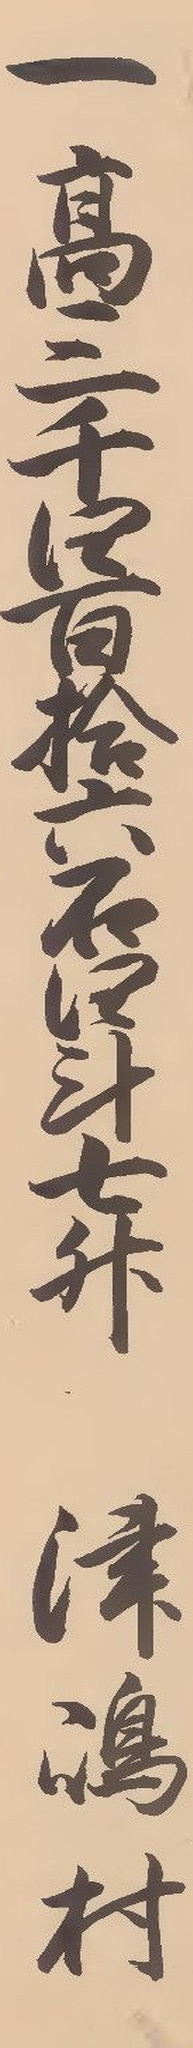一髙三千四百拾六石四斗七升津嶋村
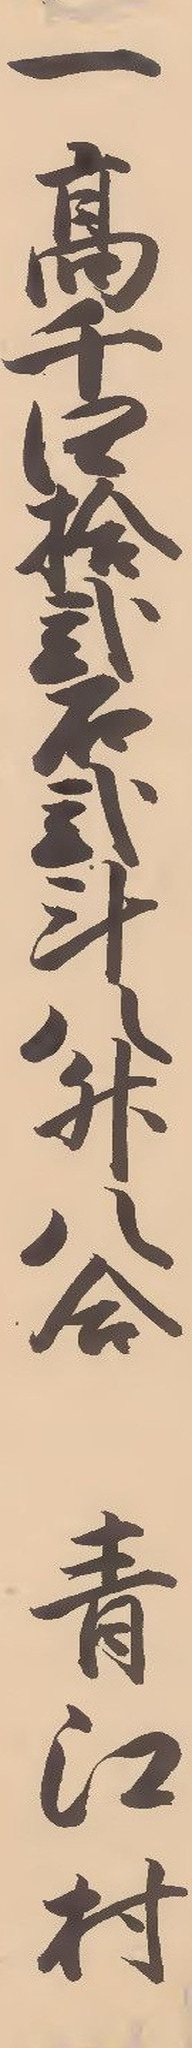一髙千四拾弐石弐斗八升八合青江村
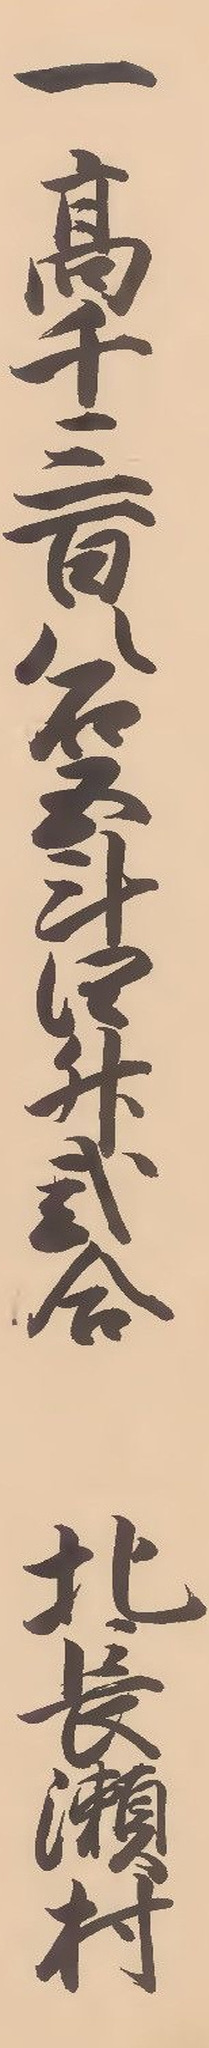一髙千三百八石五斗四升弐合北長瀬村
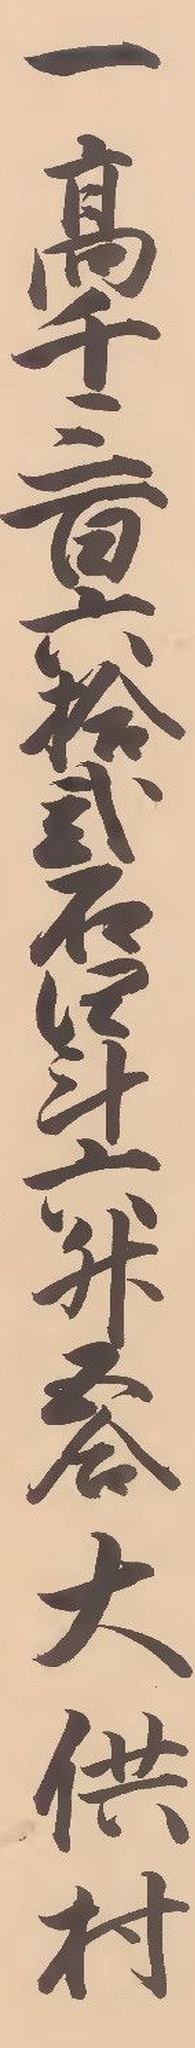一髙千三百六拾弐石四斗六升五合大供村

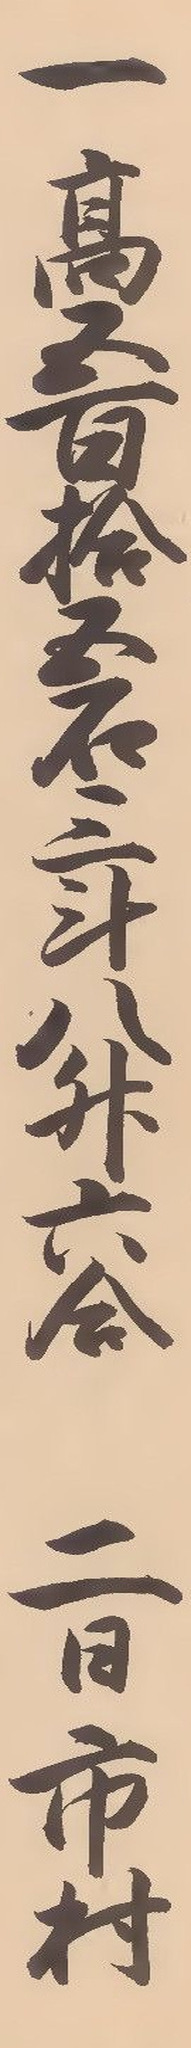一髙五百拾五石三斗八升六合二日市村
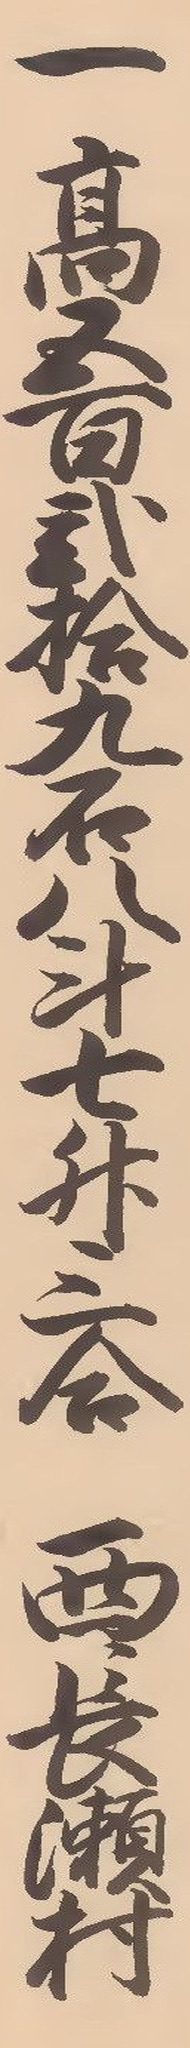一髙五百弐拾九石八斗七升三合西長瀬村
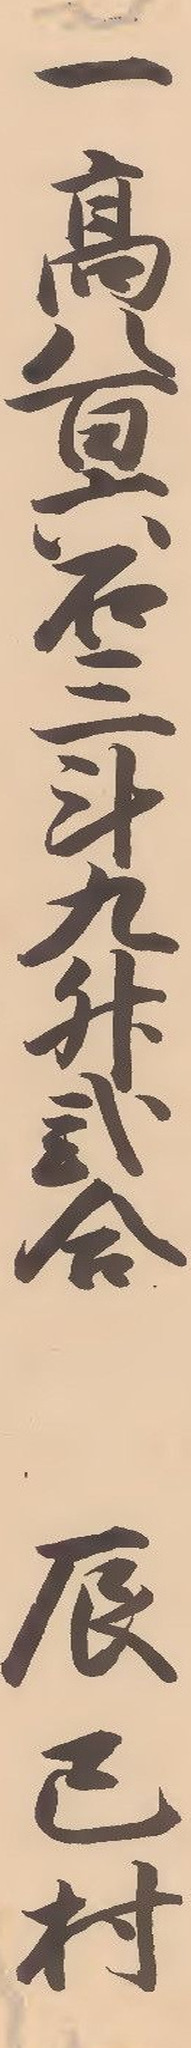一髙八百六石三斗九升弐合辰巳村
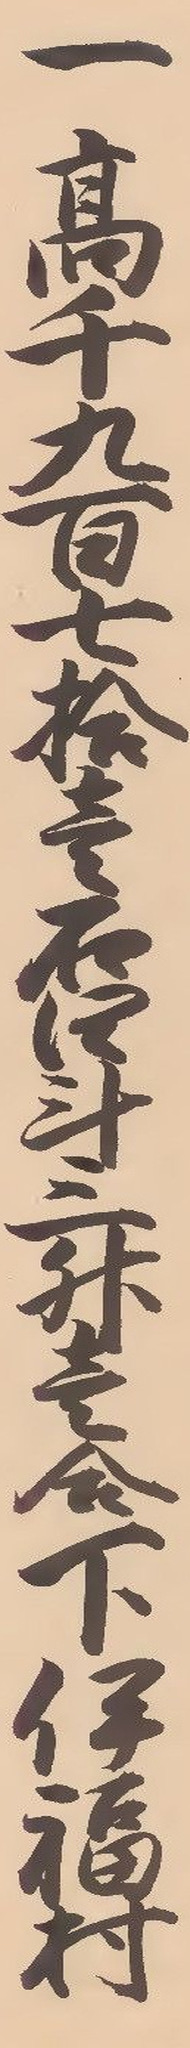一髙千九百七拾壱石四斗三升壱合下伊福村
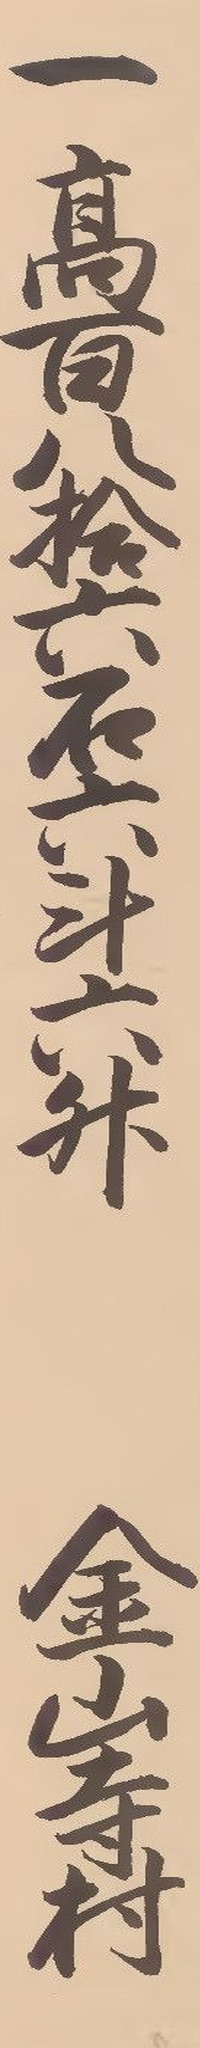一髙百八拾六石六斗六升金山寺村
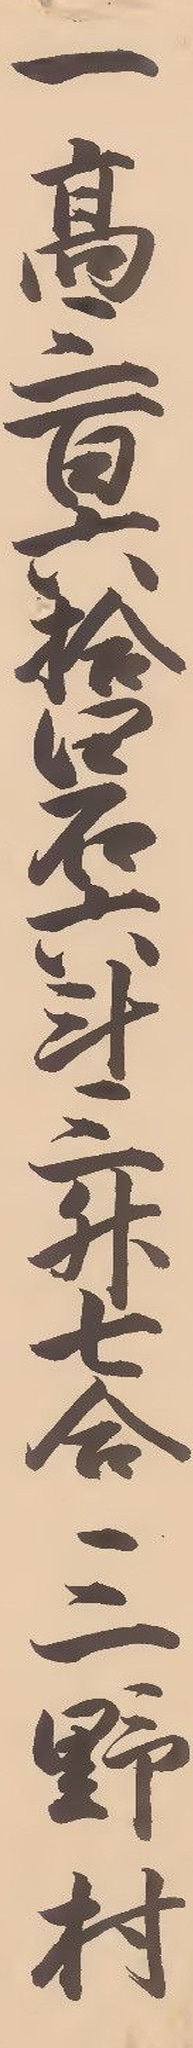一髙三百六拾四石六斗三升七合三野村
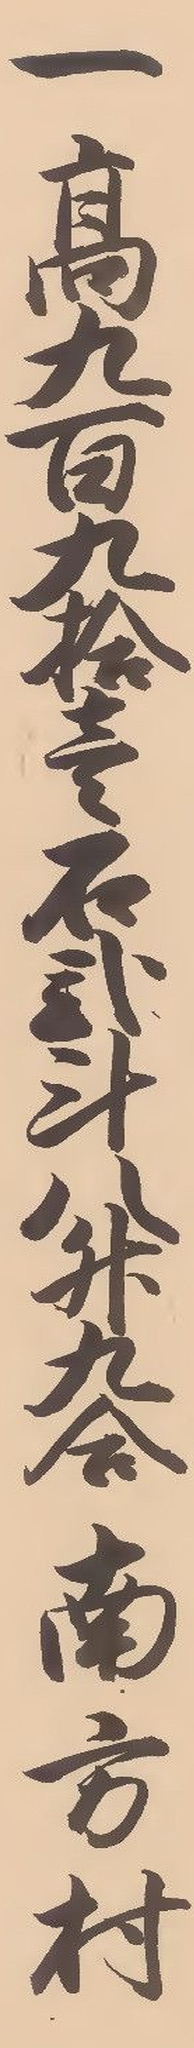一髙九百九拾壱斗弐升八升九合南方村
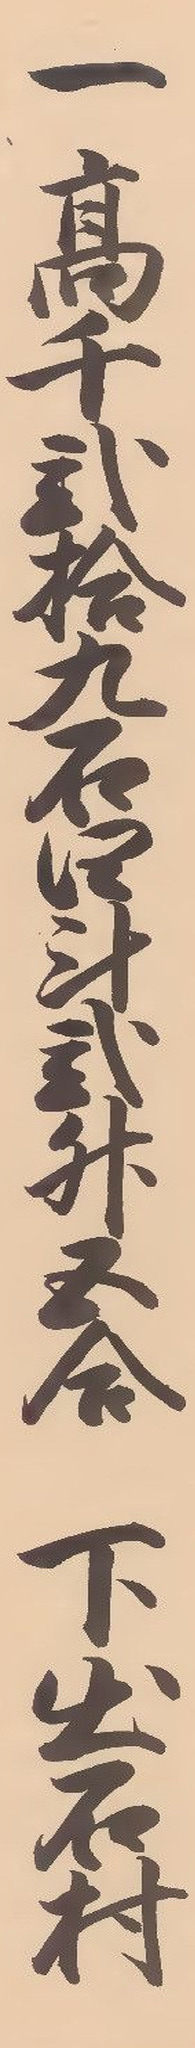一髙千弐拾九石四斗弐升五合下出石村

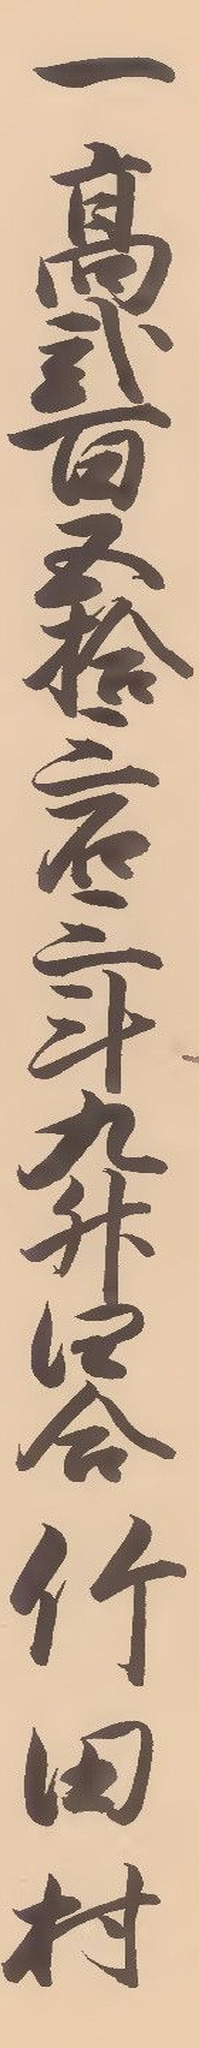一髙弐百五拾三石三斗九升四合竹田村
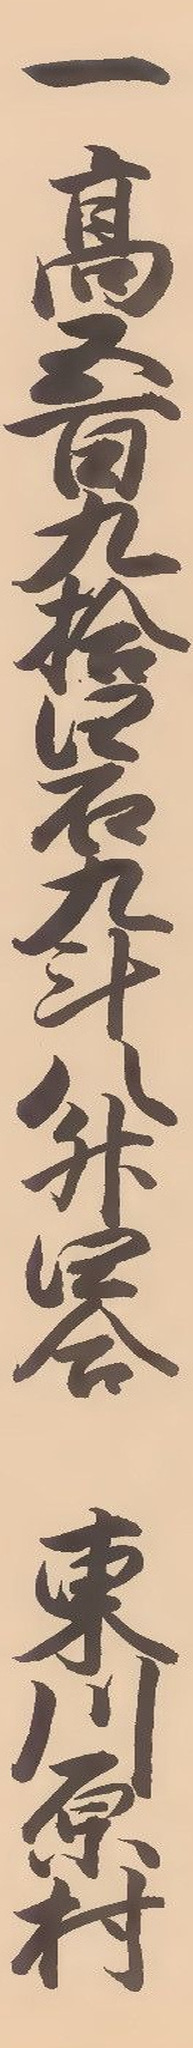一髙五百九拾四石九斗八升四合東川原村
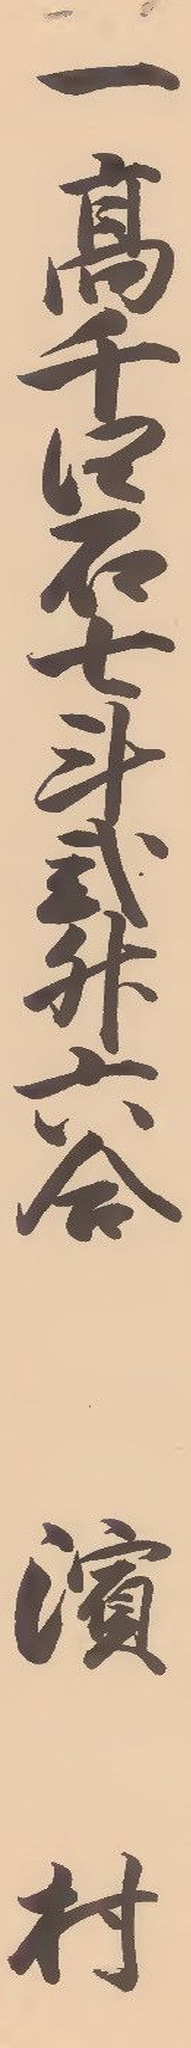一髙千四石七斗弐升六合濱村
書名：備前国郷帳
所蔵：国立公文書館 National Archives of Japan
